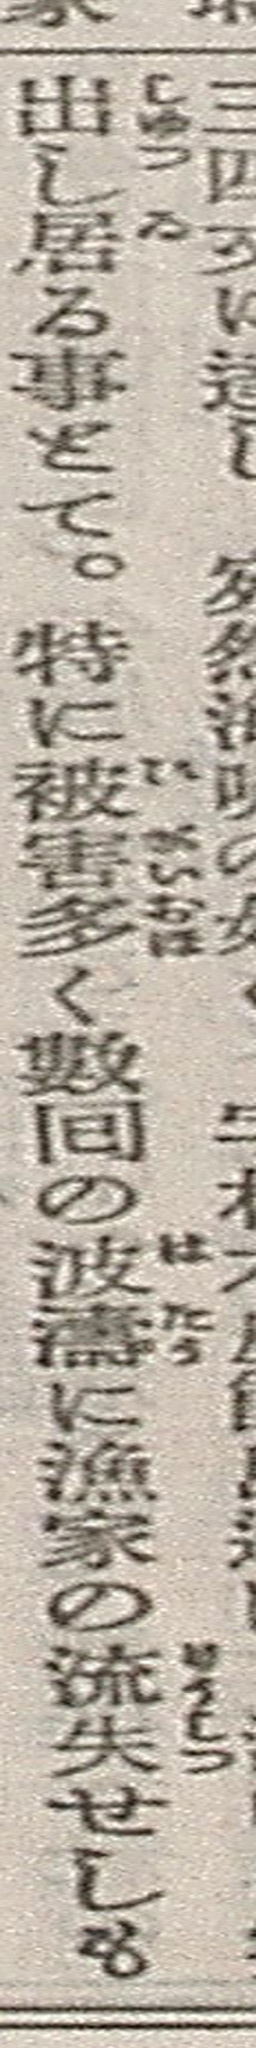出し居る事とて。特に被害多く数回の波涛に漁家の流失せしも
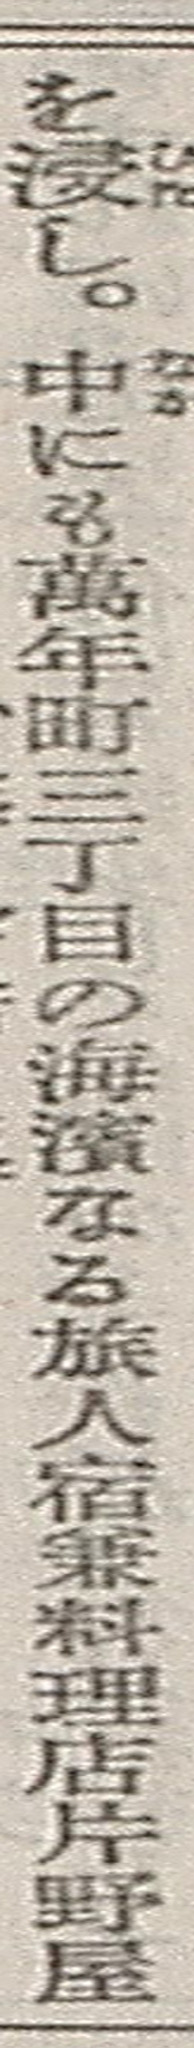を浸し。中にも万年町三丁目の海浜なる旅人宿兼料理店片野屋
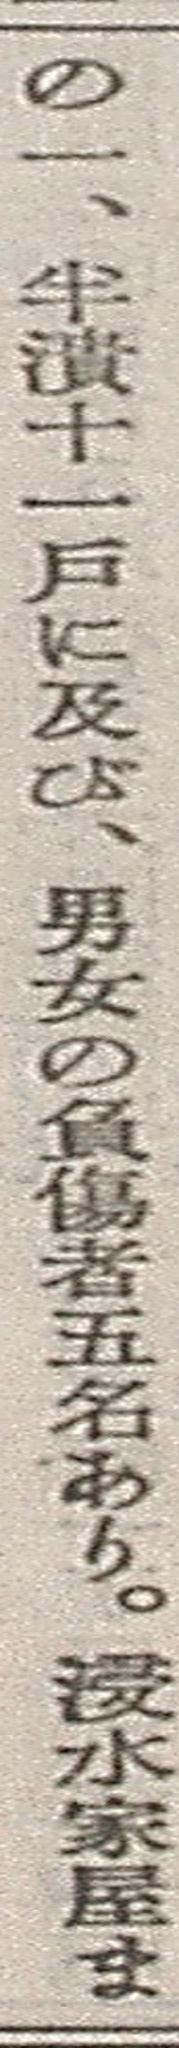の一、半潰十一戸に及び、男女の負傷者五名あり。浸水家屋ま
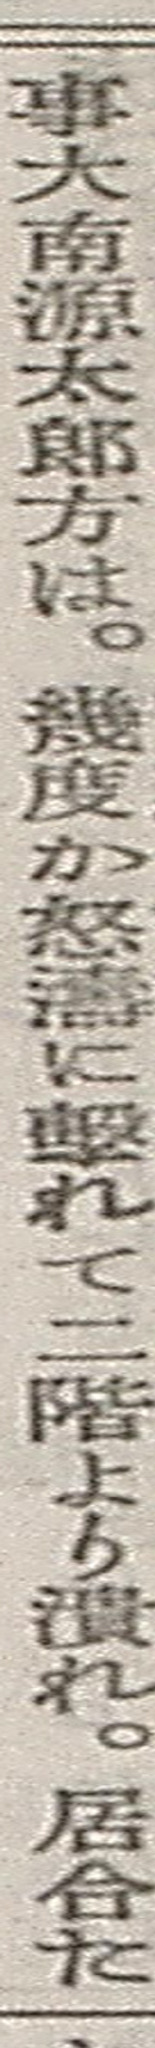事大南源太郎方は。幾度か怒涛に撃れて二階より潰れ。居合た
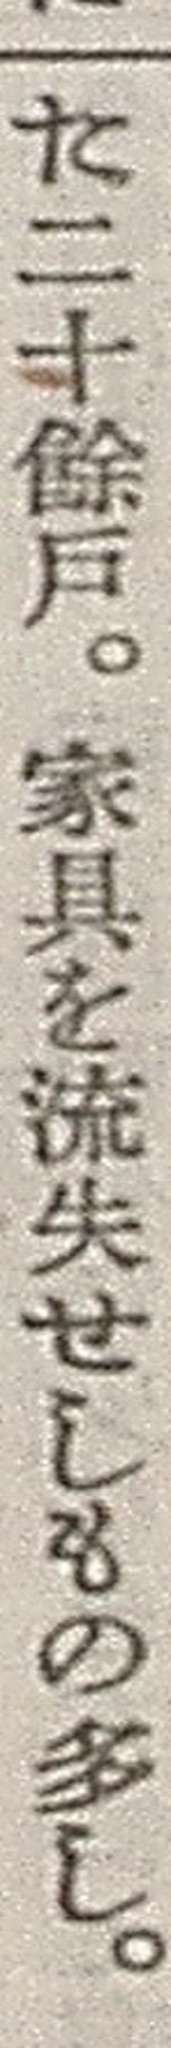た二十余戸。家具を流失せしもの多し。
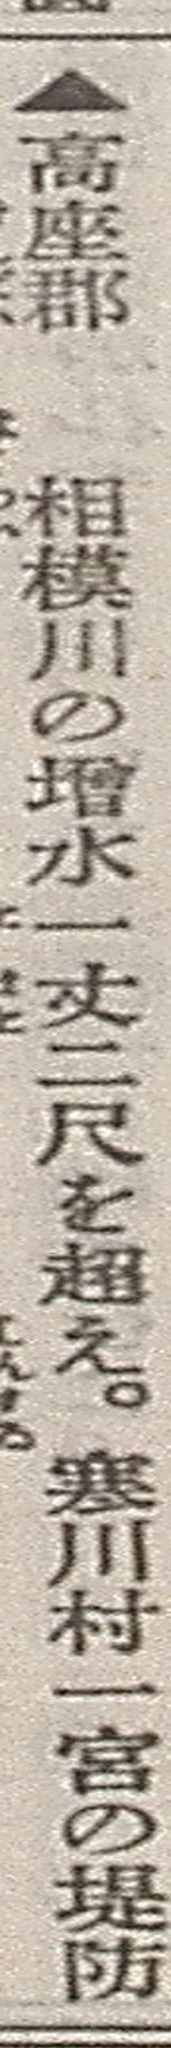▲高座郡相模川の増水一丈二尺を超え。寒川村一ノ宮の堤防
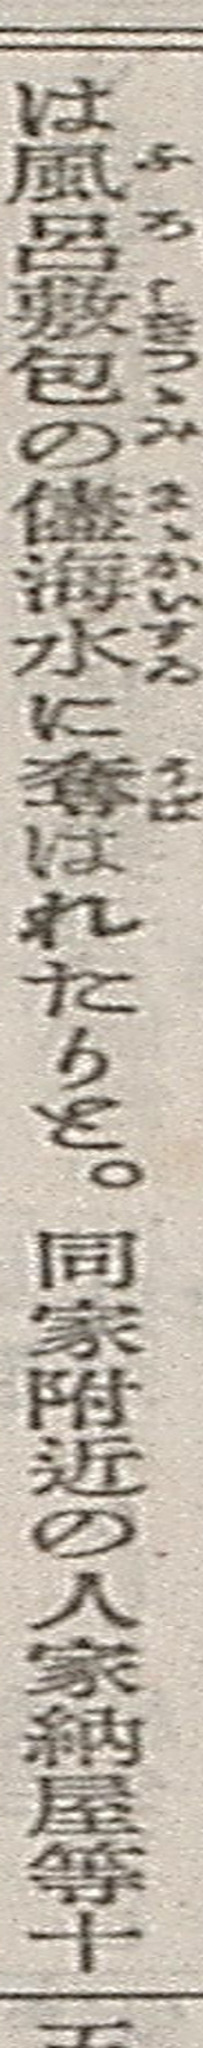は風呂敷包の侭海水に奪はれたりと。同家附近の人家納屋等十
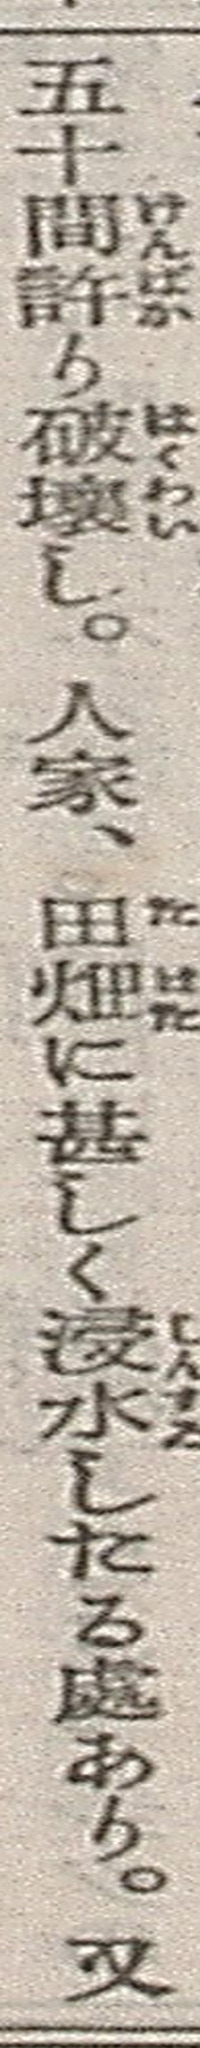五十間許り破壊し。人家、田畑に甚しく浸水したる処あり。又
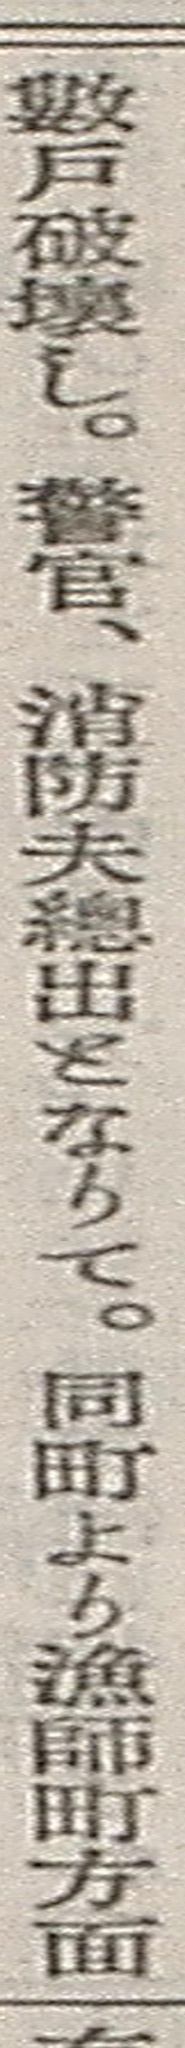数戸破壊し。警官、消防夫総出となりて。同町より漁師町方面
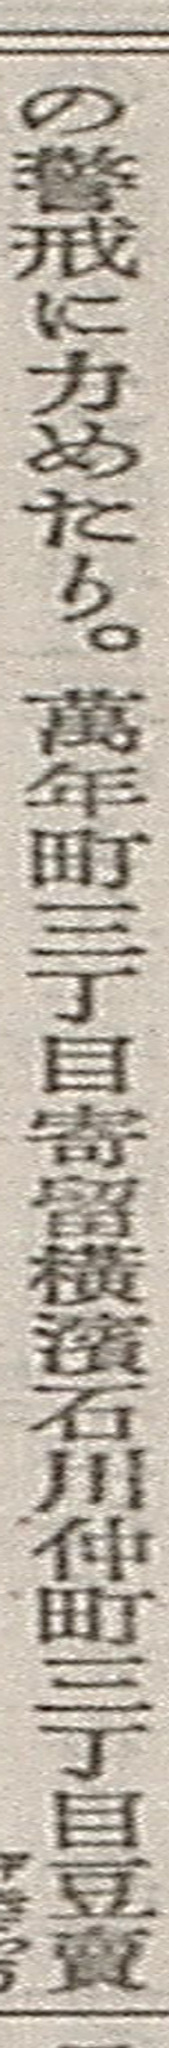の警戒に力めたり。万年町三丁目寄留横浜石川仲町三丁目豆売
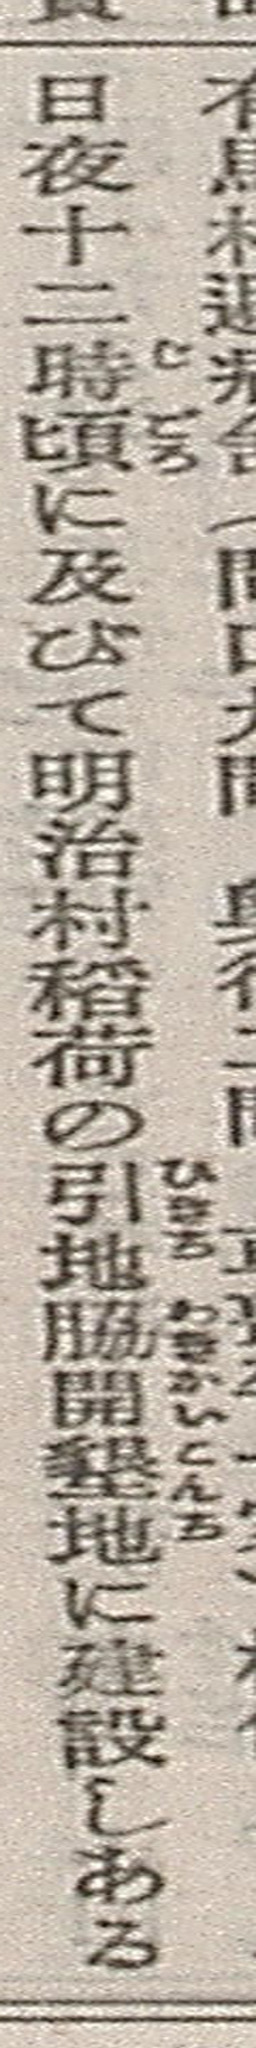日夜十二時頃に及びて明治村稲荷の引地脇開墾地に建設しある
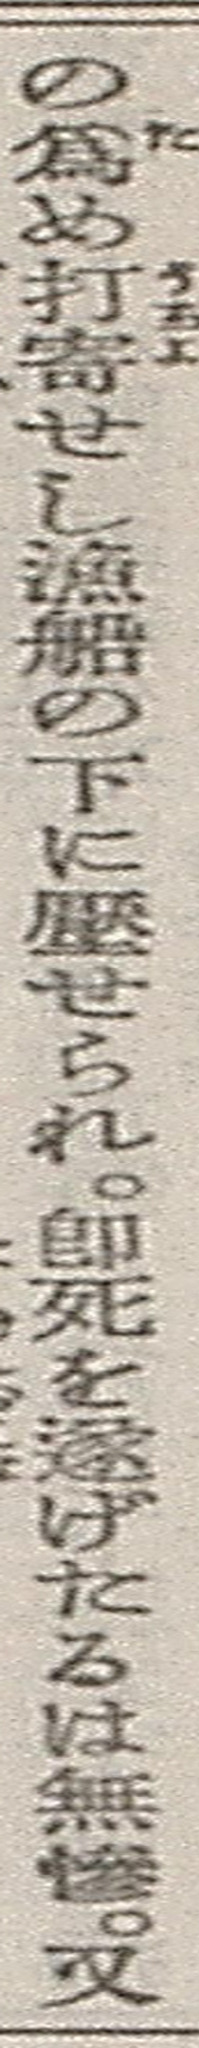の為め打寄せし漁船の下に圧せられ。即死を遂げたるは無惨。又
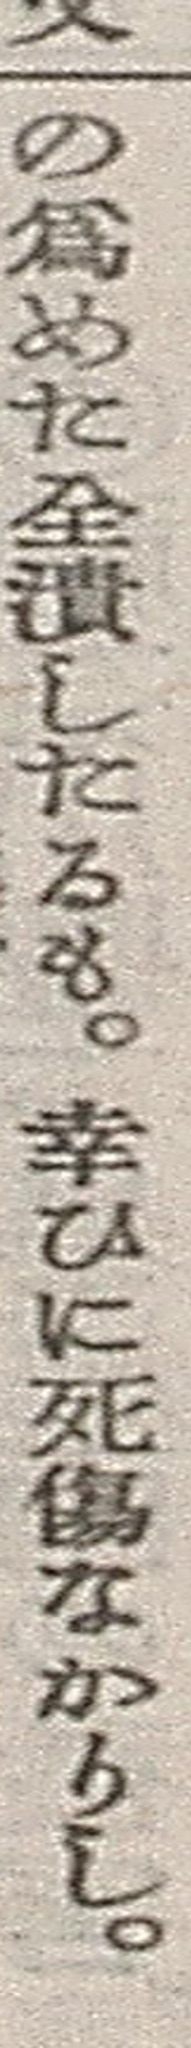の為めた全潰したるも。幸ひに死傷なかりし。
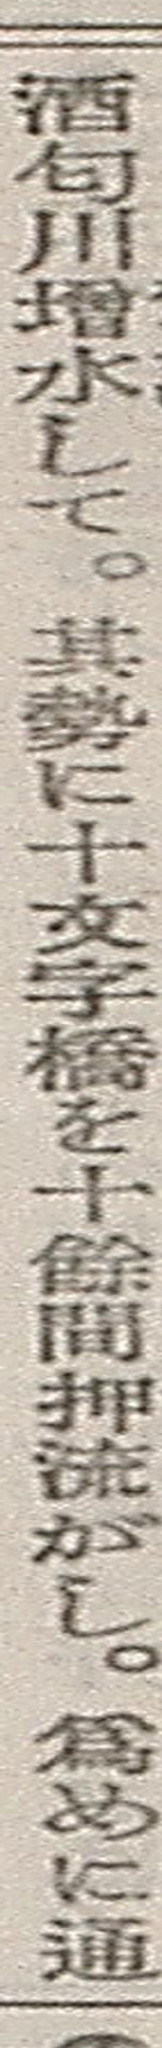酒匂川増水して。其勢に十文字橋を十余間押流がし。為めに通
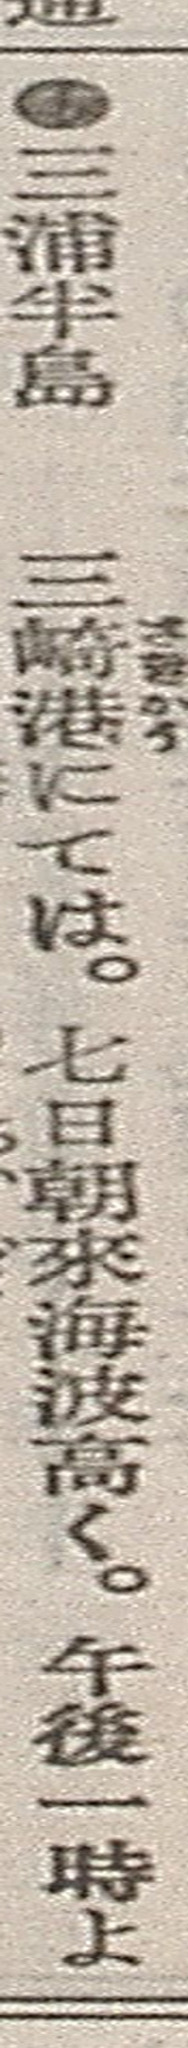●三浦半島三崎港にては。七日朝来海波高く。午後一時よ
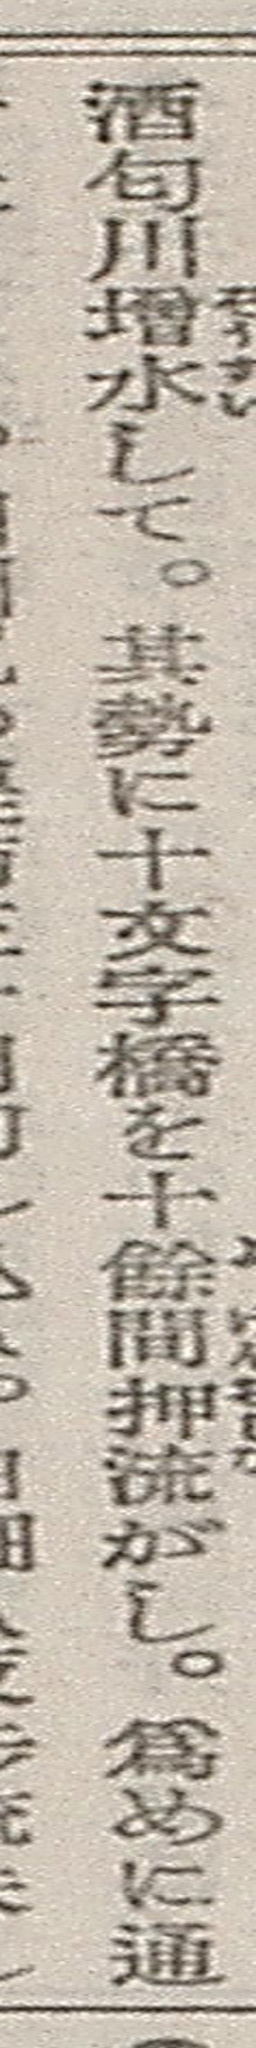酒匂川増水して。其勢に十文字橋を十余間押流がし。為めに通
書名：風俗畫報臨時増刊第百九十九號　明治三十二年十月各地災害圖會（前編之續）
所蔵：東京大学地震研究所図書室 Earthquake Research Institute Library, The University of Tokyo, JAPAN
